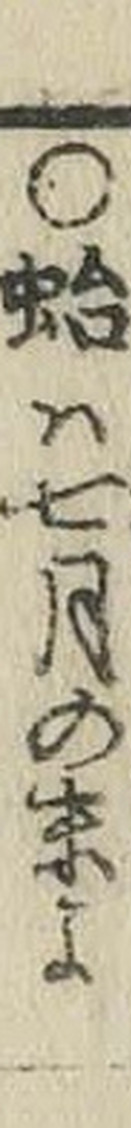○𧉟は七月の末よ
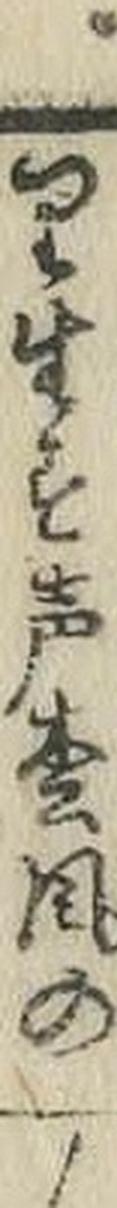り生す声枩風の
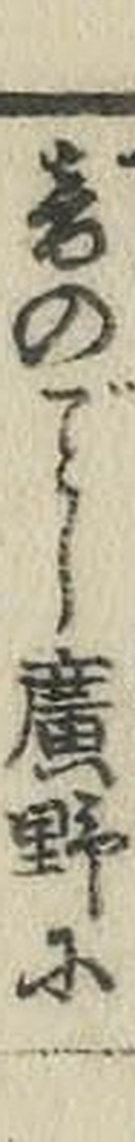音のごとし広野に
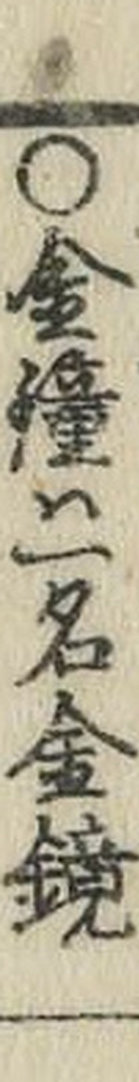○金鐘は一名金鏡
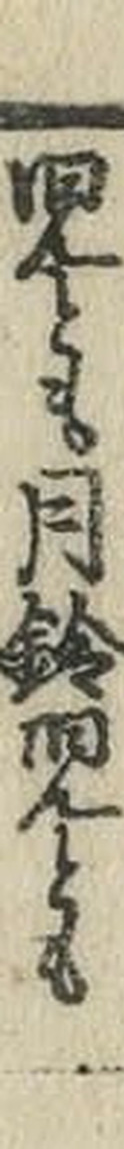児とも月鈴児とも
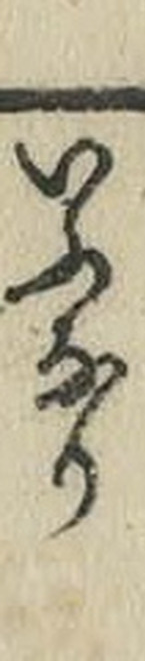いふなり

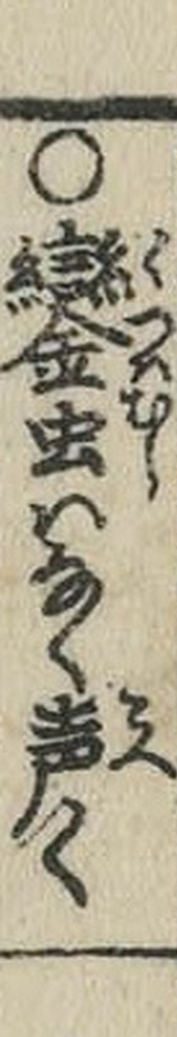鑾虫はなく声く
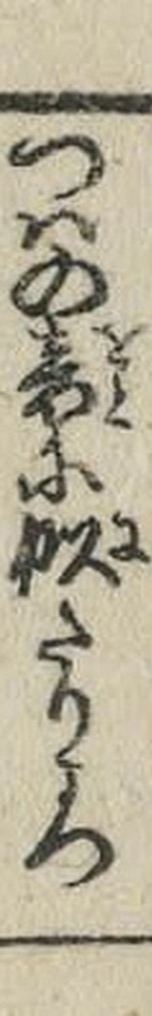つはの音に似たりよつ
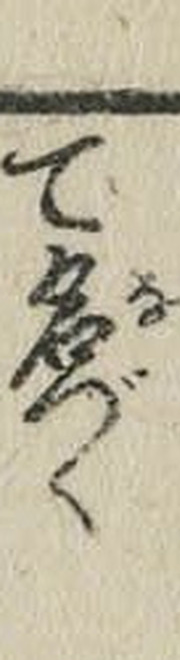て名づく
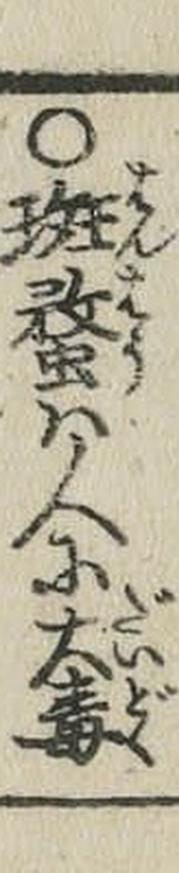○斑蝥は人に大毒
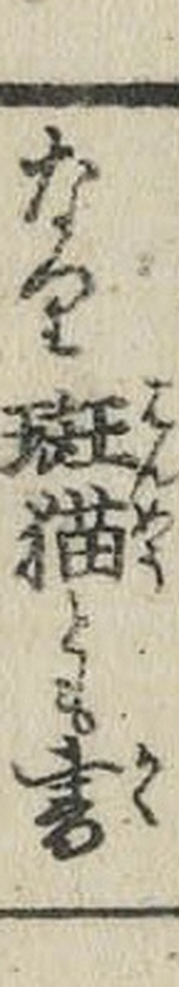なり斑猫とも書
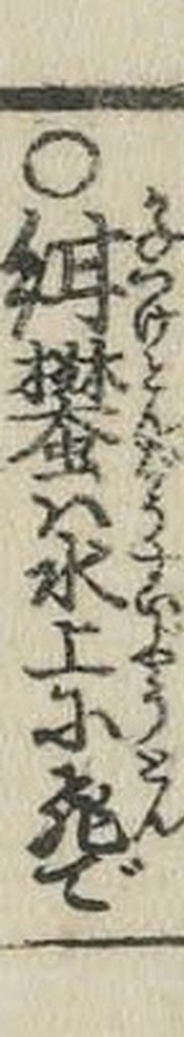○紺蠜は水上に飛で
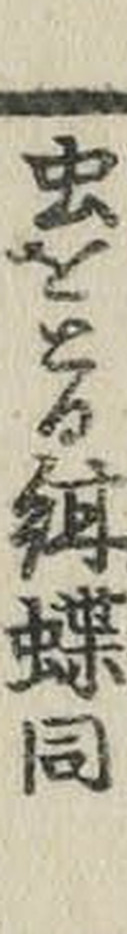虫をとる紺蝶同
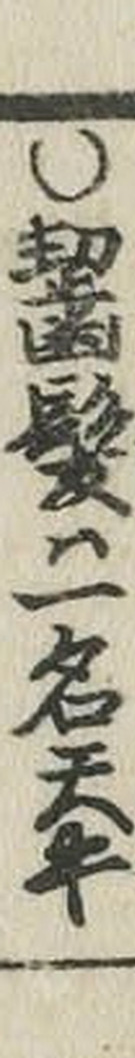○齧髪は一名天牛
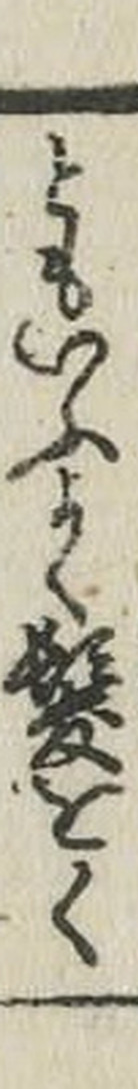ともいふよく髪をく
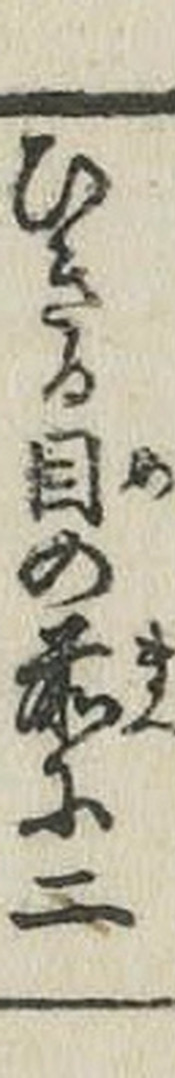ひきる目の前に二
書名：増補頭書訓蒙図彙大成 10巻 7:巻之14-16
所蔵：東京学芸大学教育コンテンツアーカイブ
